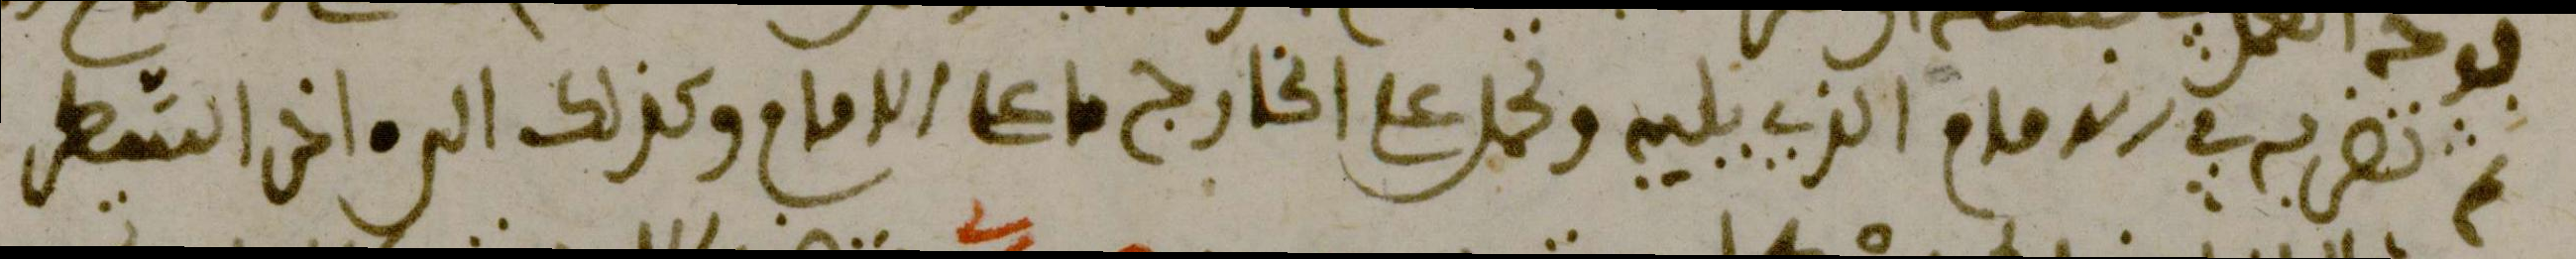ثم تضربه في الامام الذي يليه و تحمل على الخارج ما على الامام و كذلك الى ءاخر السّطر
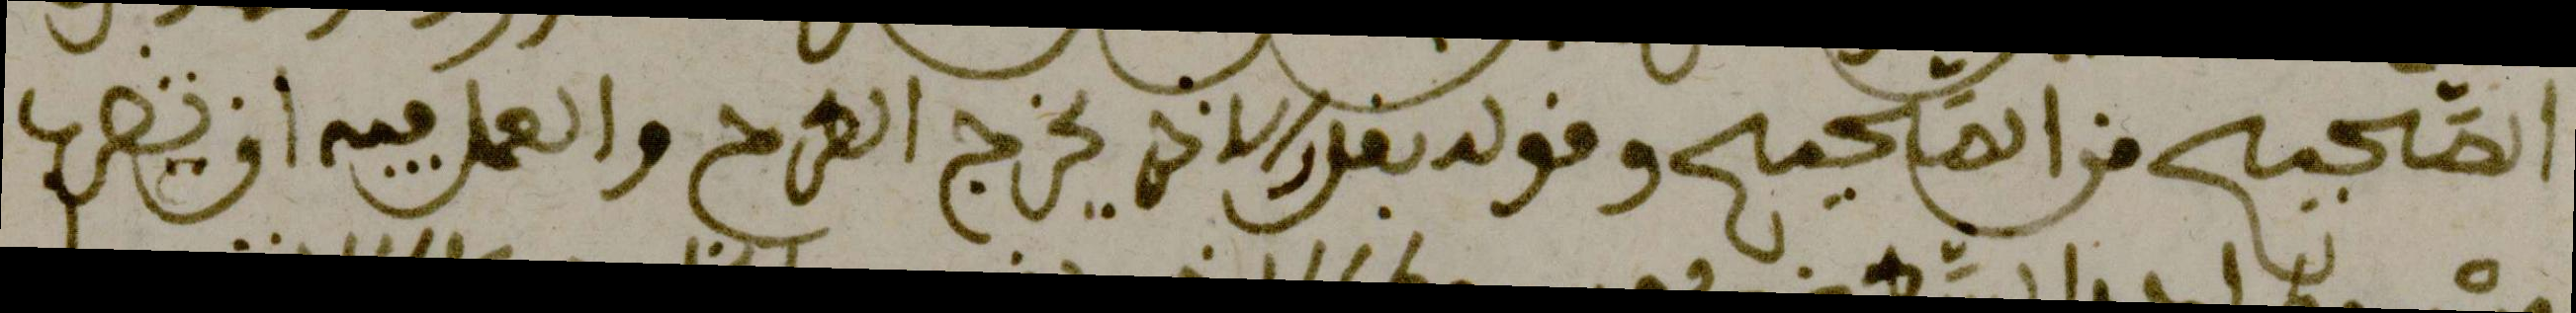الصّحيح من الصّحيح و قوله و قوله بقدر الاخر يخرج الطرح و العمل فيه ان تضرب
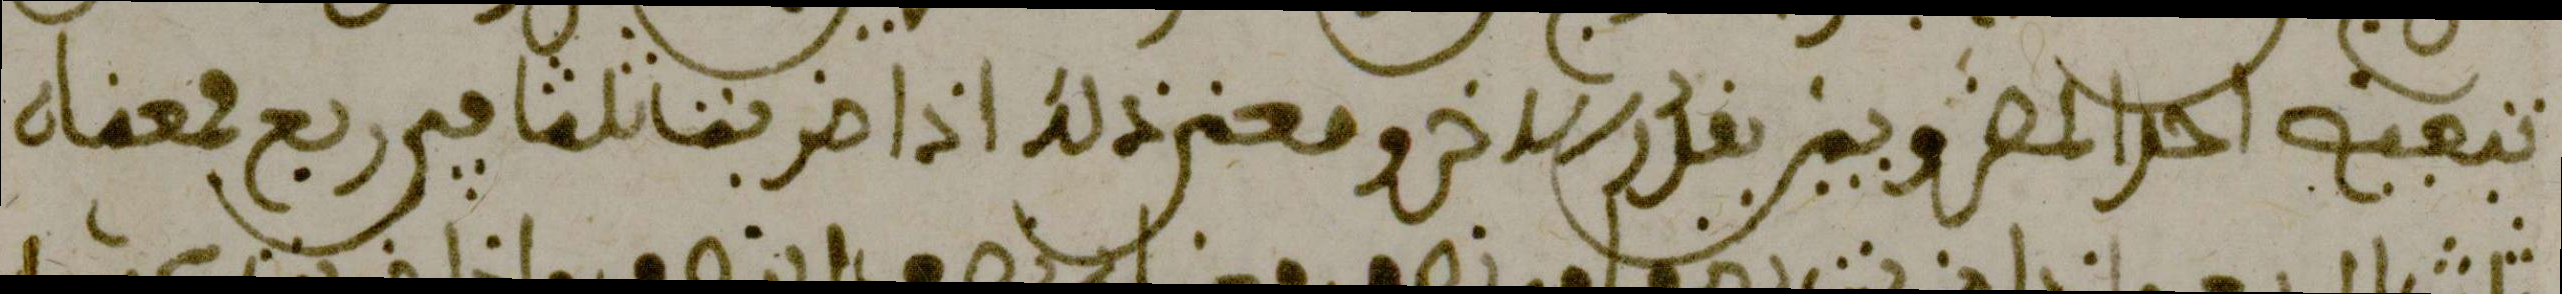تبعيض احد المضروبين بقدر الاخر و معنى ذلك اذا ضربت ثلثا في ربع فمعناه
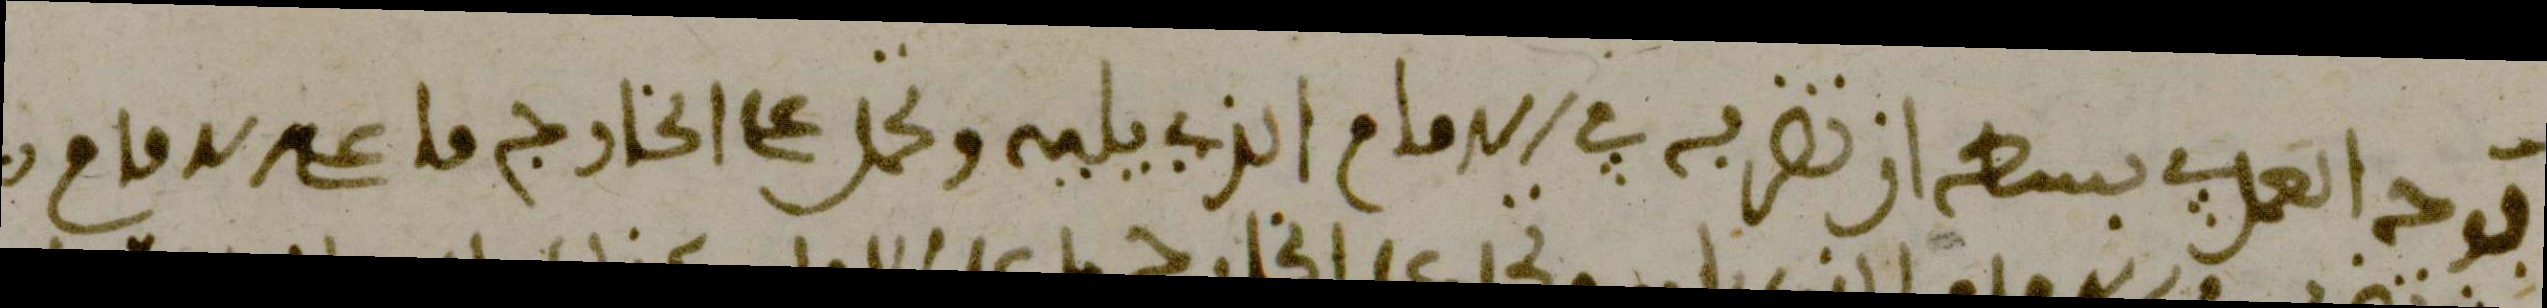فوجه العمل في بسطه ان تضربه في الامام الذي يليه و تحمل على الخارج ما على الامام
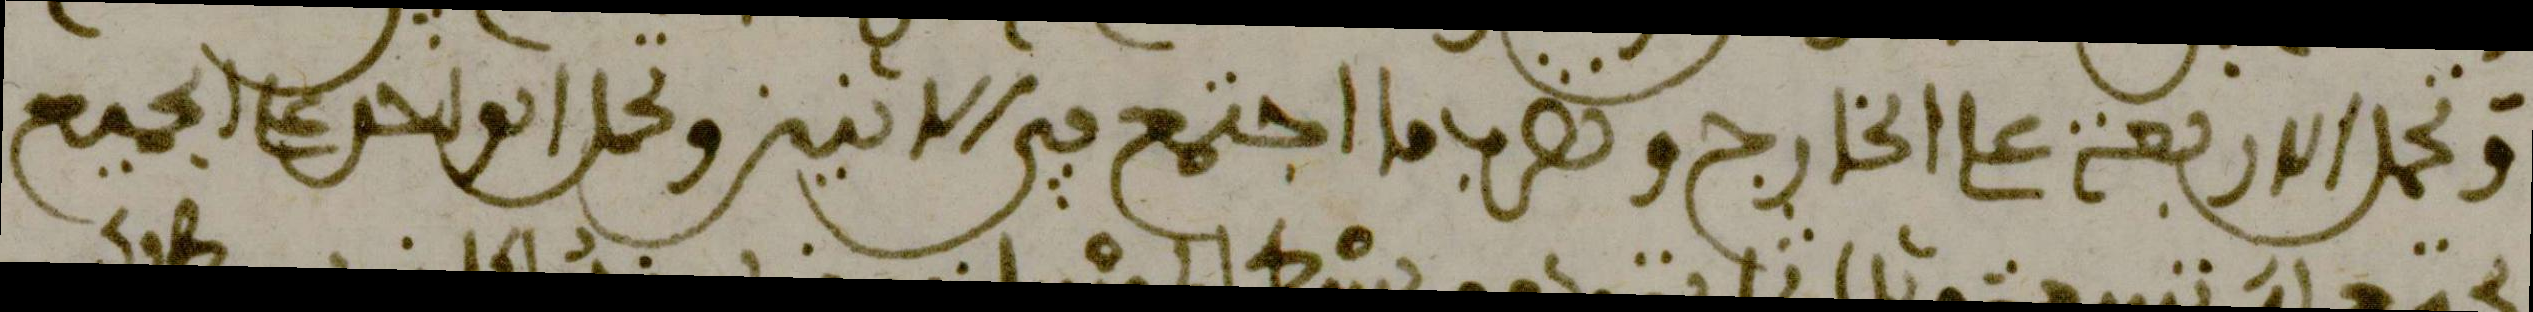و تحمل الاربعة على الخارج و تضرب ما اجتمع في الاثنين و تحمل الواحد على الجميع
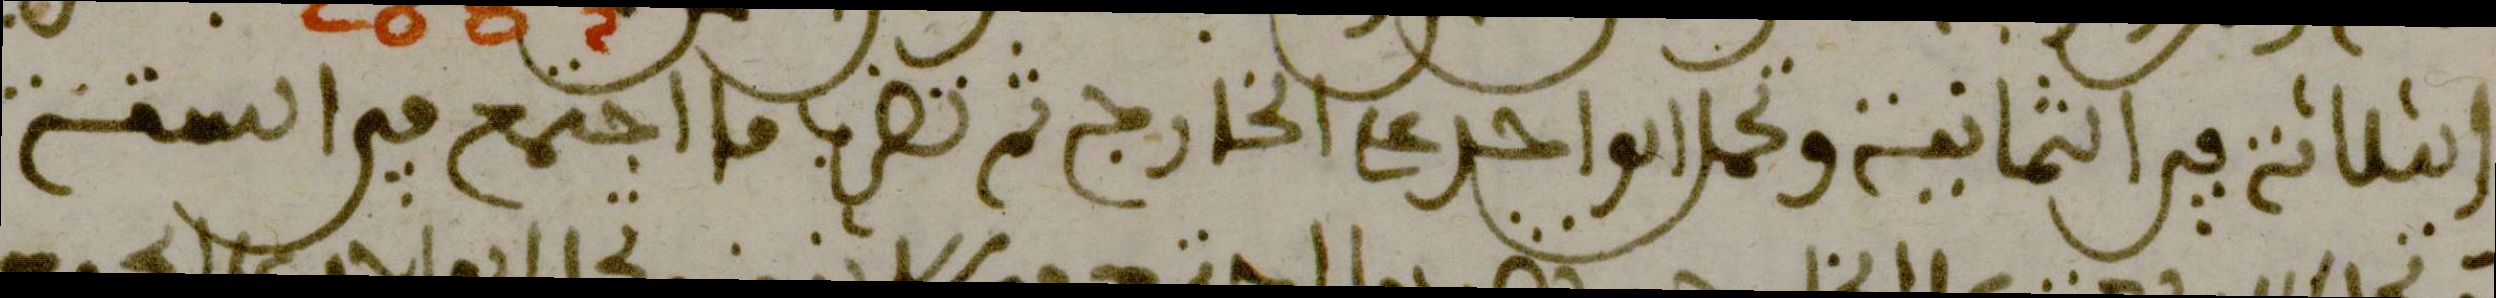الثلاثة في الثمانية و تحمل الواحد على الخارج ثم تضرب ما اجتمع في الستة
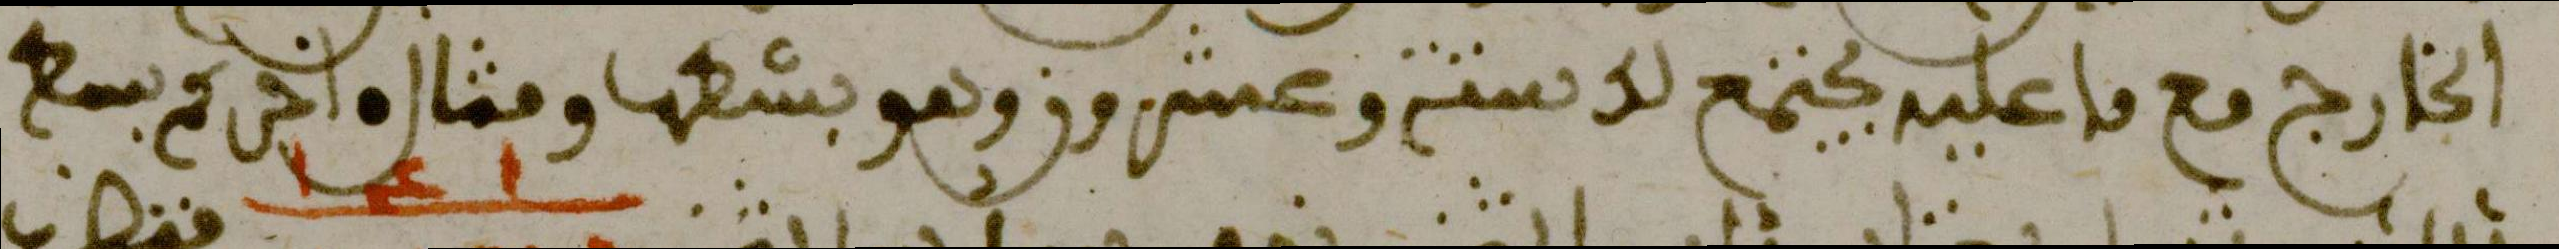الخارج مع ما عليه يجتمع لك ستة و عشرون و هو بسطها و مثال ءاخر كم بسط
